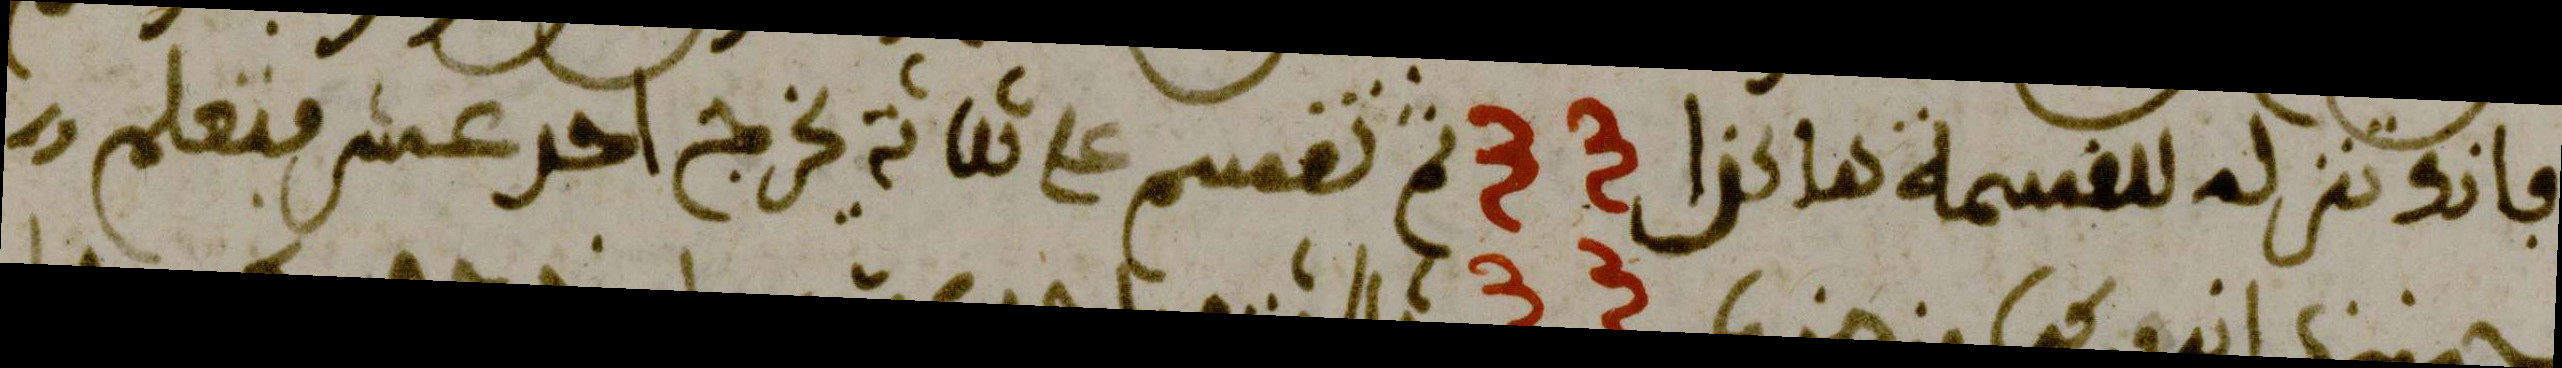فانك تنزله للقسمة هاكذا 33 ثم تقسم على ثلاثة يخرج احد عشر فتعلم
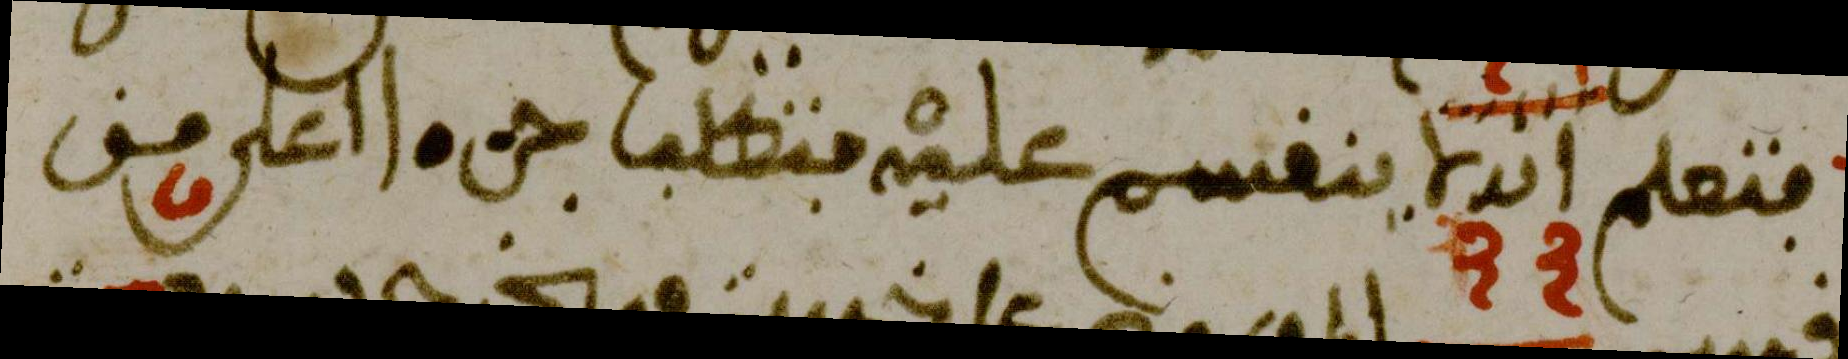فتعلم انه لا ينقسم عليه فتطلب جزءا اعلى من
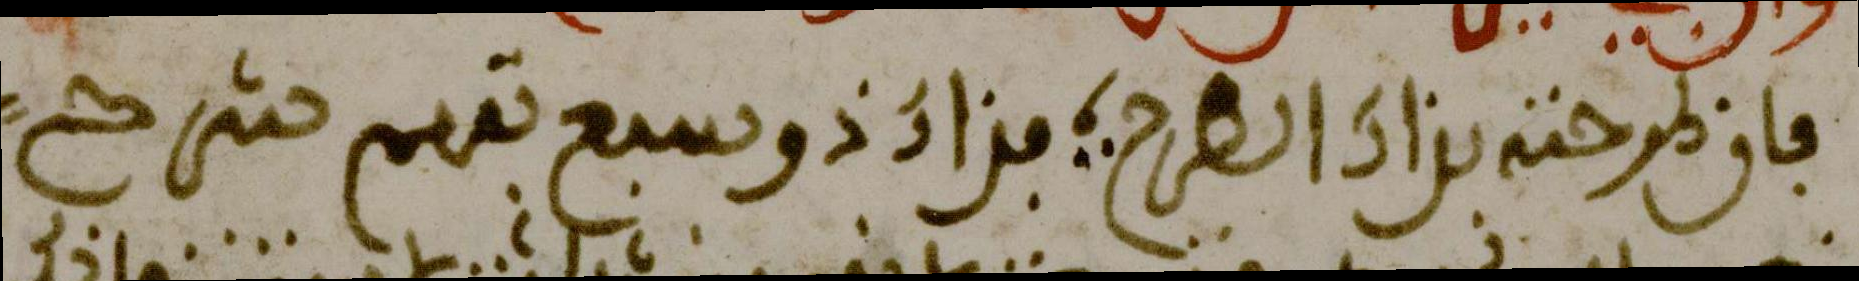فان طرحته بذاك الصرح فذاك ذو سبع تفهم شرح
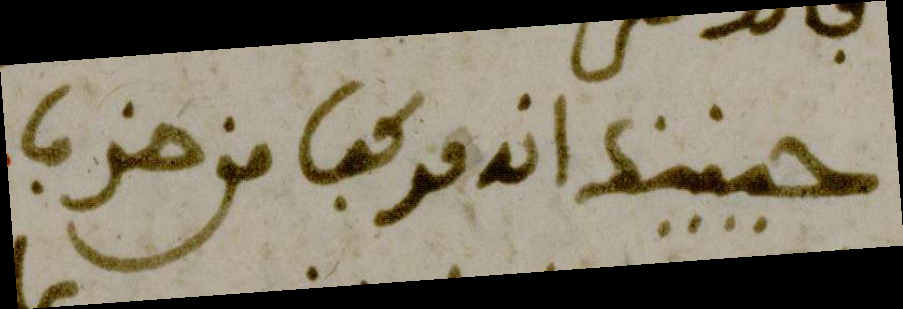حينيذ انه مركب من ضرب
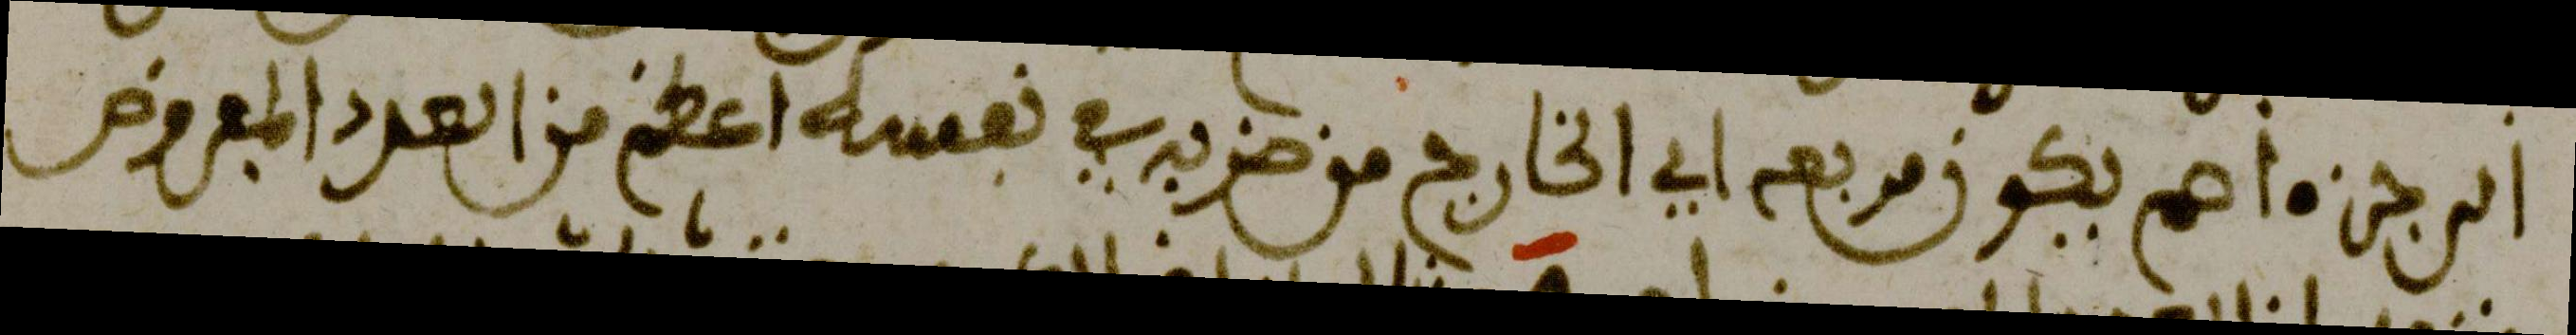الى جزء اصم يكون مربعه اي الخارج من ضربه في نفسه اعظم من العدد المفروض
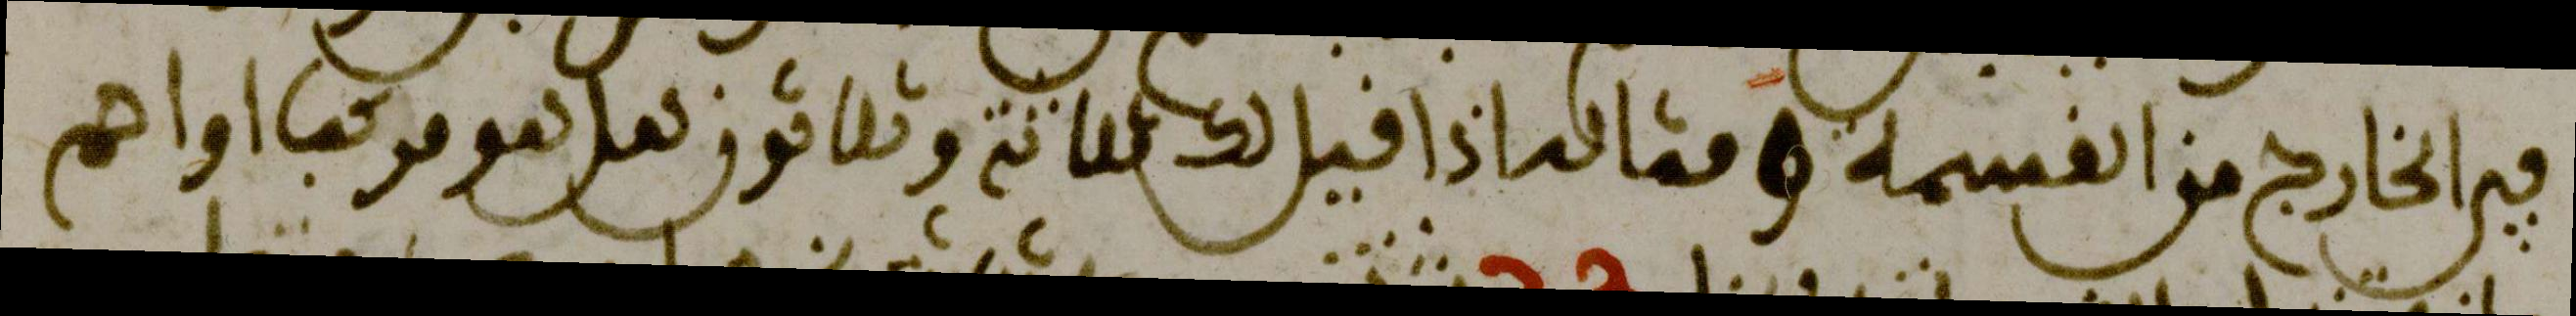في الخارج من القسمة ومثاله اذا قيل لك ثلاثة وثلاثون هل هو مركب او اصم
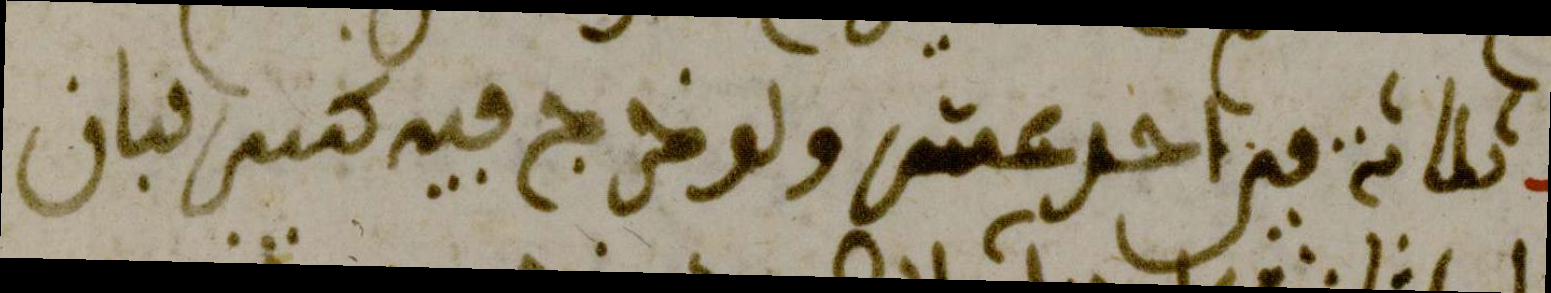ثلاثة في احد عشر ولو خرج فيه كسر لبان
